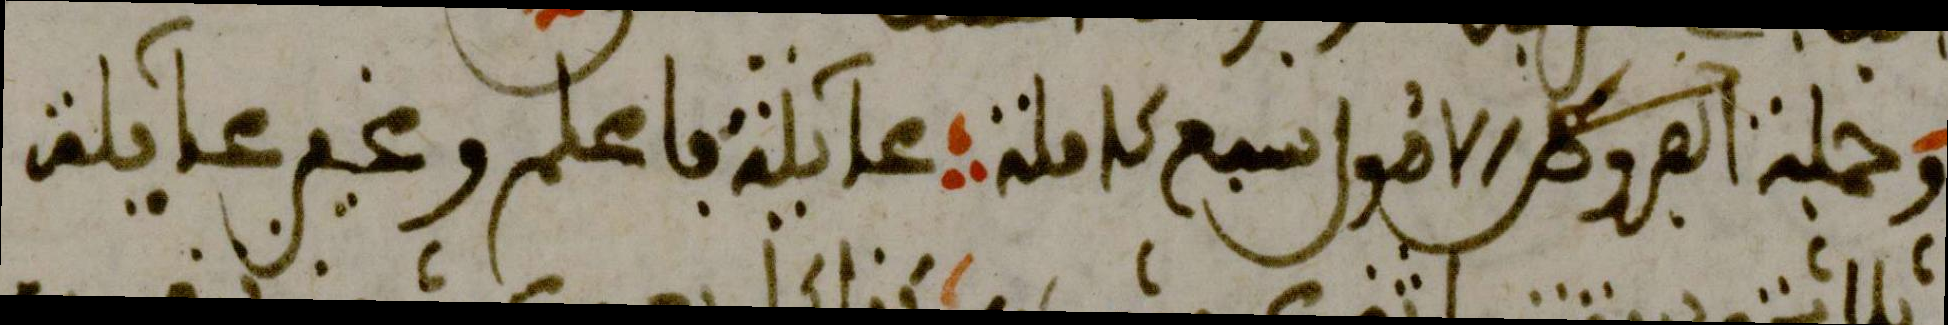وَجملة الفروض الاصول سبع كامله عائلة فاعلم وغير عائلة
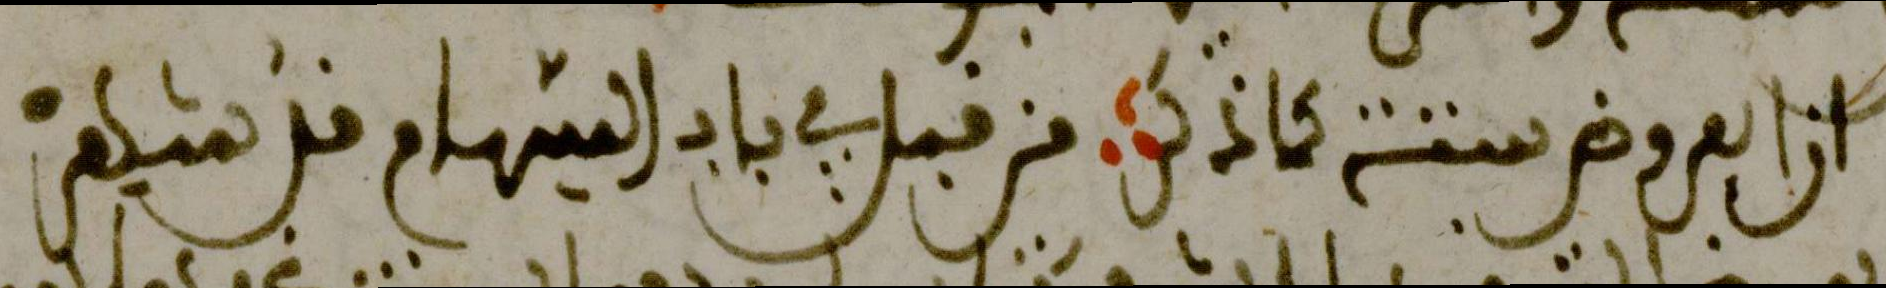ان الفروض ستة كما ذكر من قبل في باب السِّهام قدد شهر
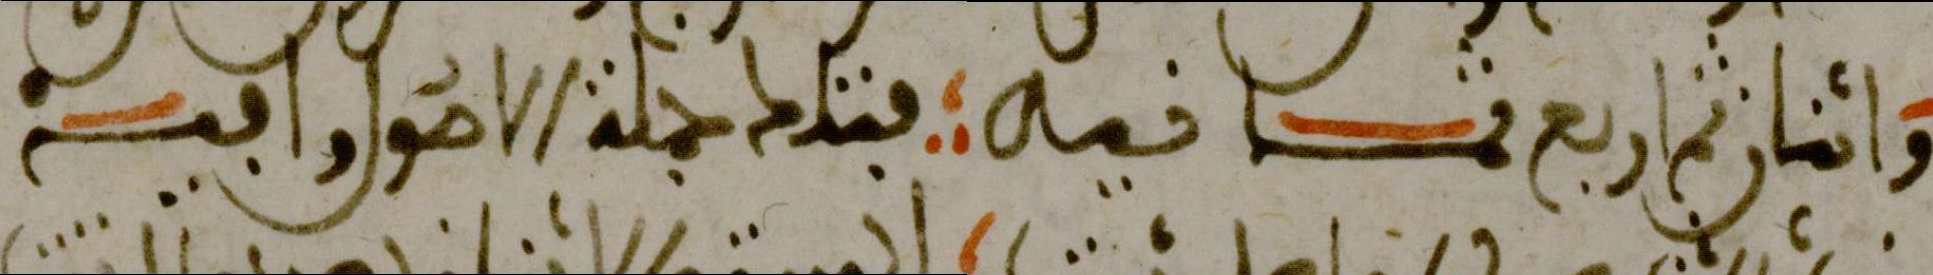واثنان ثم اربع ثمَانيه فتلك جملة الاصول وافيه
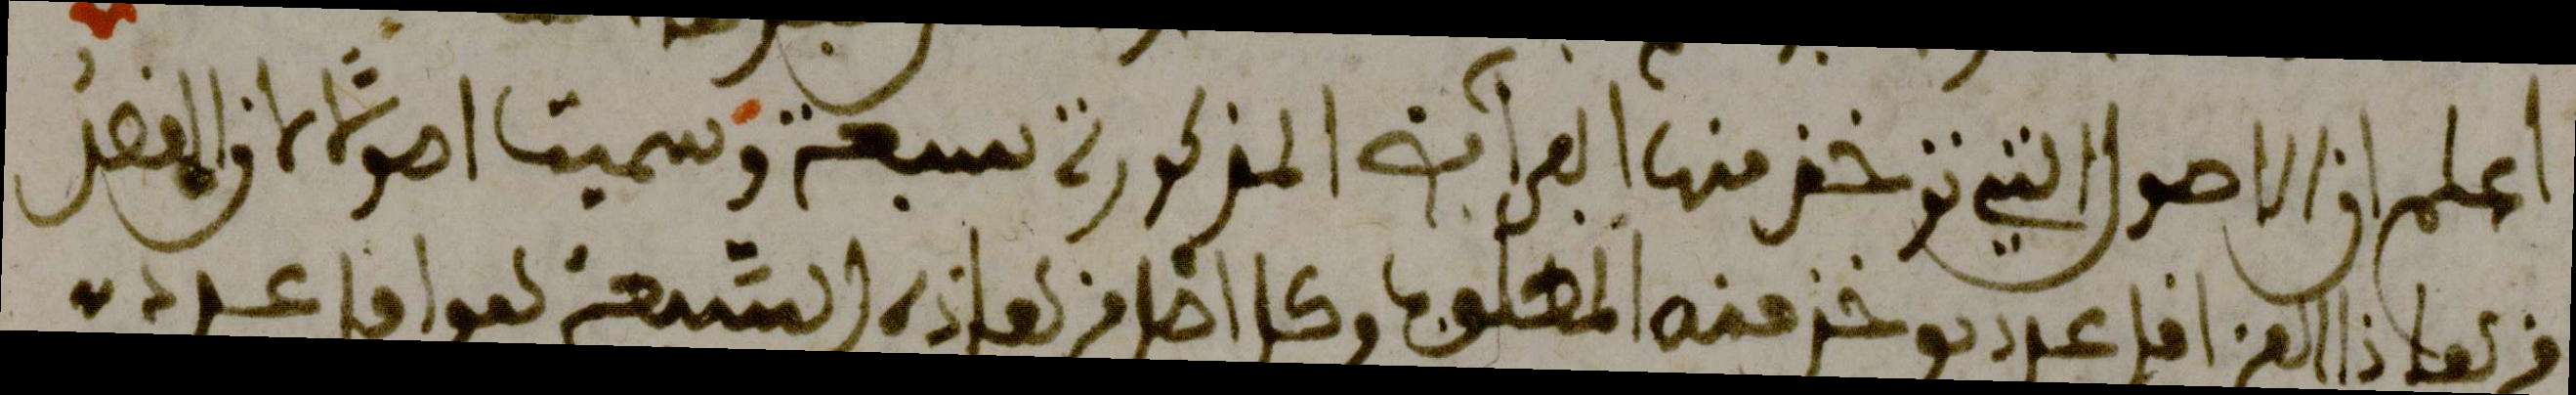اعلم ان الاصول التي توخذ منها الفرائض المذكورة سبعة وَسميت اصولًا لان المقصد
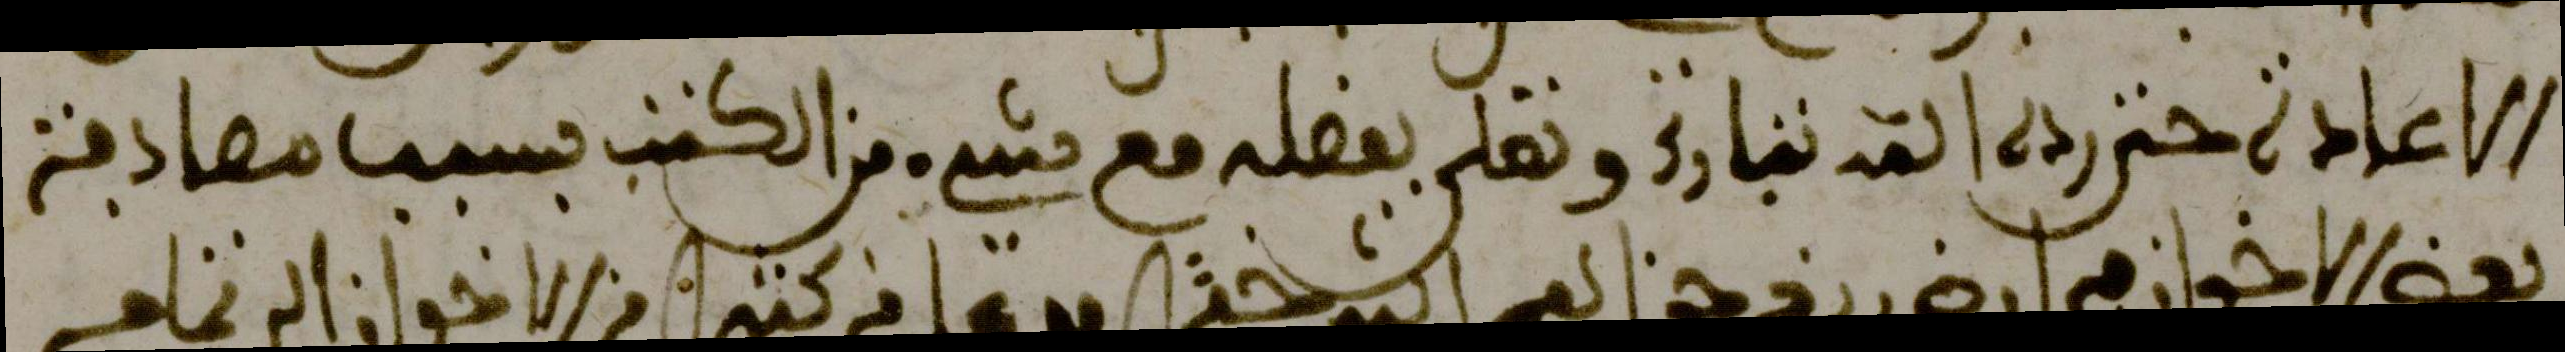الاعادة حتى رده الله تبارك وتعلى يفضله مع شيء من الكتب بسبب مصادفة
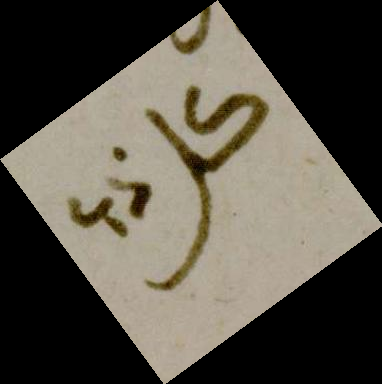كل ذي
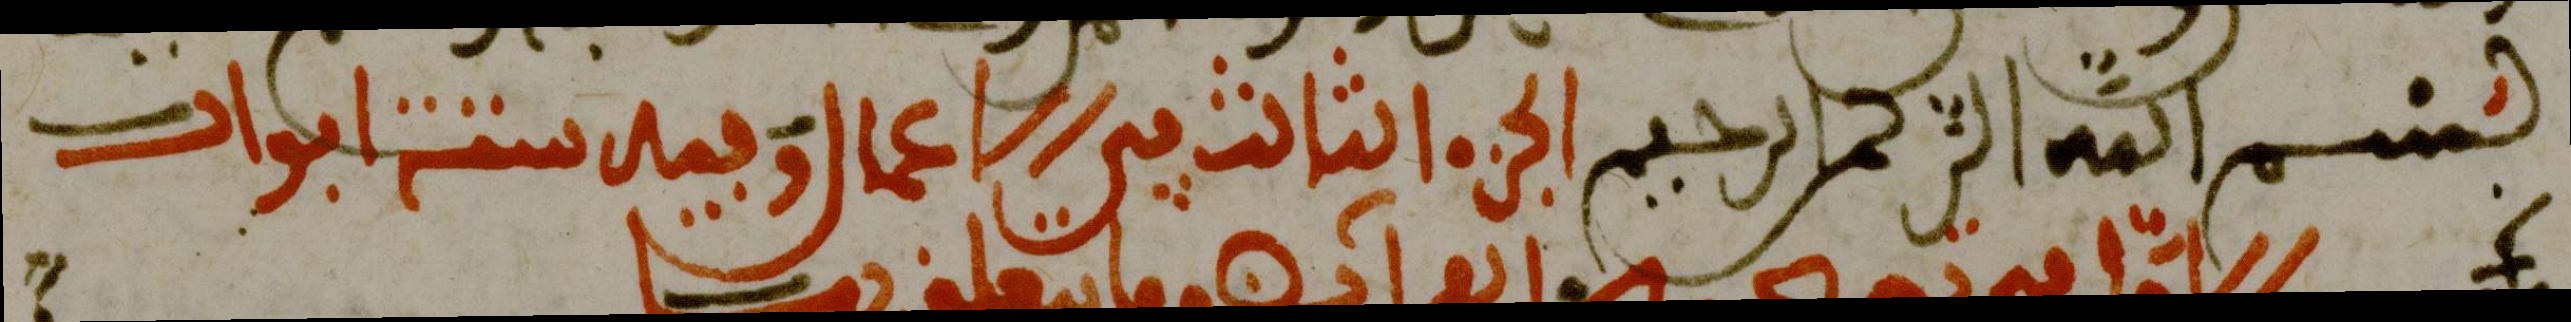بسْم الله الرحمن الرحيم الجزء الثالث في الاعمال وَفيه ستة ابواب
